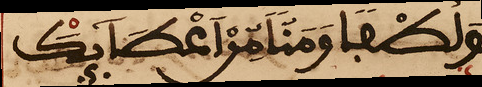و لطفا و منا من اعطائك
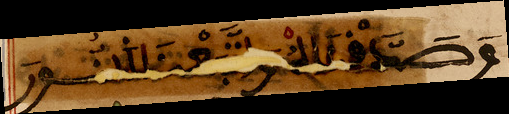و صدق # النور
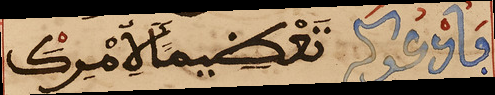فادعوك تعظيمالامرك
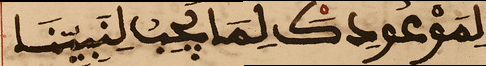لموعودك لما يجب لنبينا
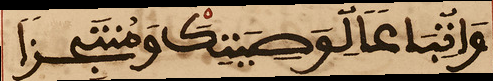واتباعا لوصيتك منتجزا
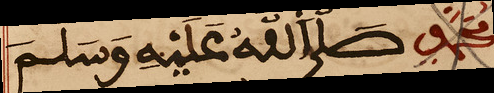محمد صلى الله عليه و سلم
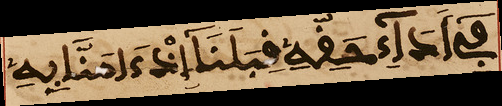في اداء حقه قبلنا إذ ءامنابه
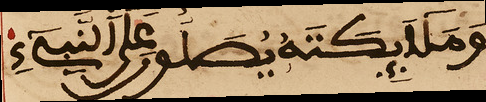وملائكته يصلون على النبيء
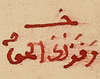و قولك الحق
